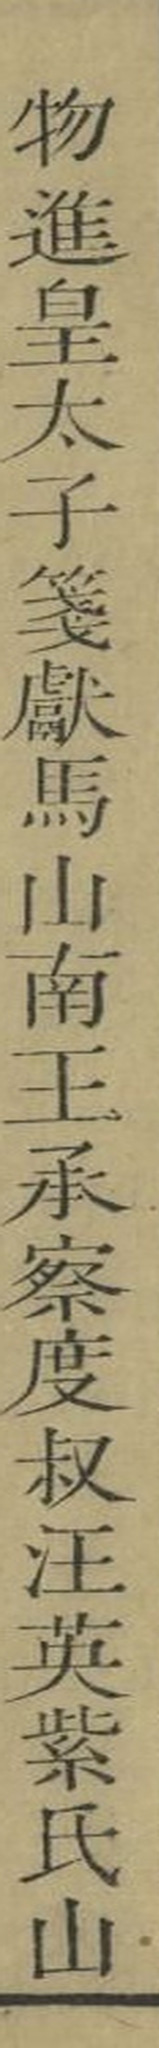物進皇太子箋献馬山南王承察度叔汪英紫氏山
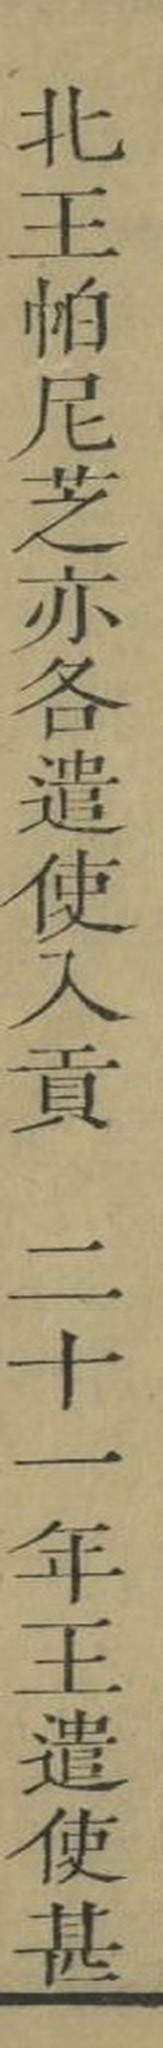北王帕尼芝亦各遣使入貢二十一年王遣使甚
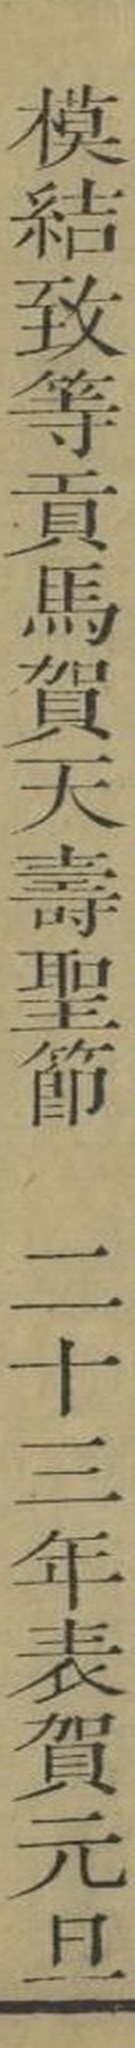模結致等貢馬賀天寿聖節二十三年表賀元旦
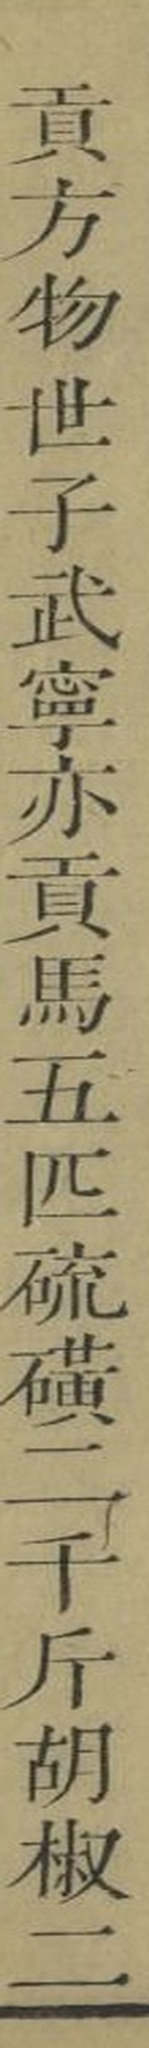貢方物世子武寧亦貢馬五匹硫磺二千斤胡椒二
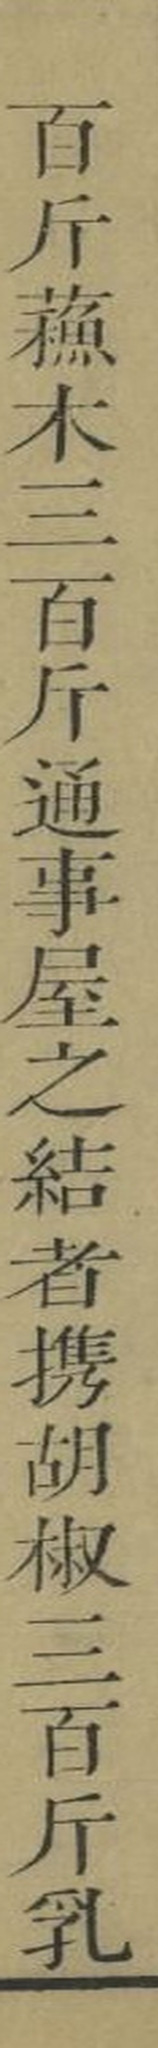百斤蘇木三百斤通事屋之結者携胡椒三百斤乳
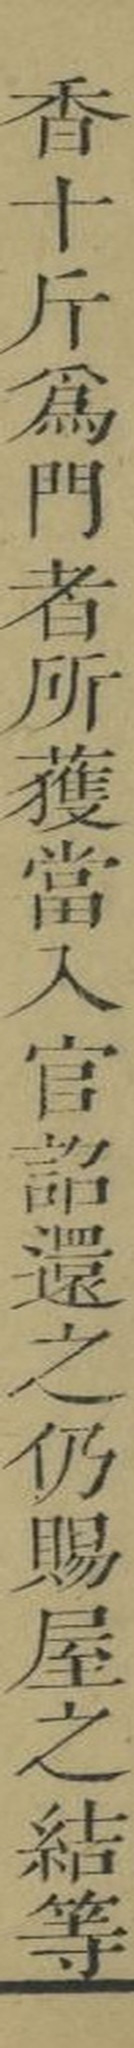香十斤為門者所獲当入官詔還之仍賜屋之結等
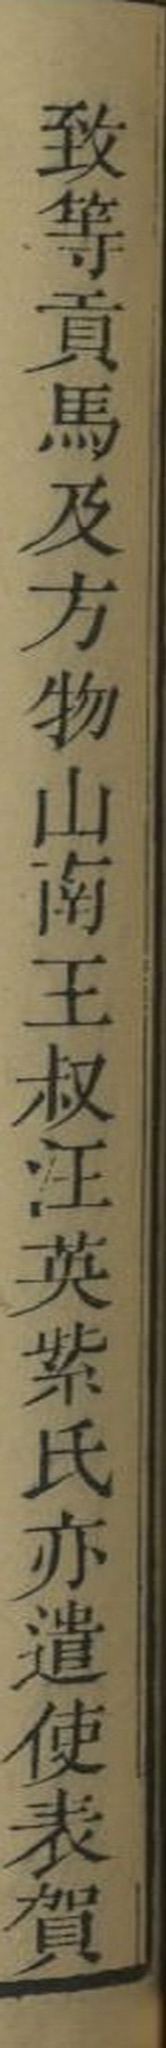致等貢馬及方物山南王叔汪英紫氏亦遣使表賀
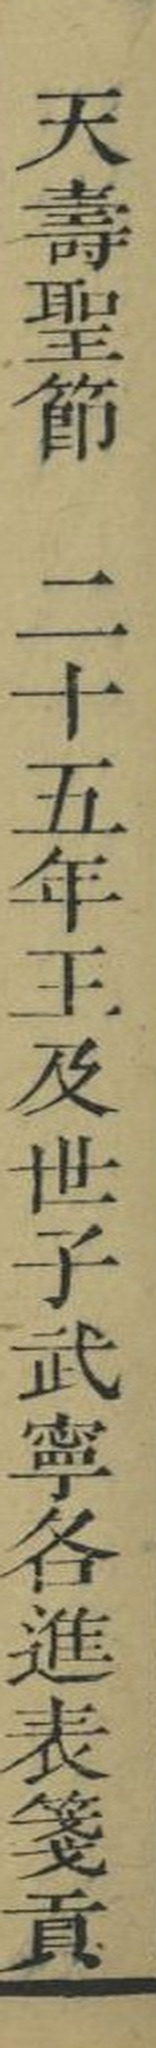天寿聖節二十五年王及世子武寧各進表箋貢
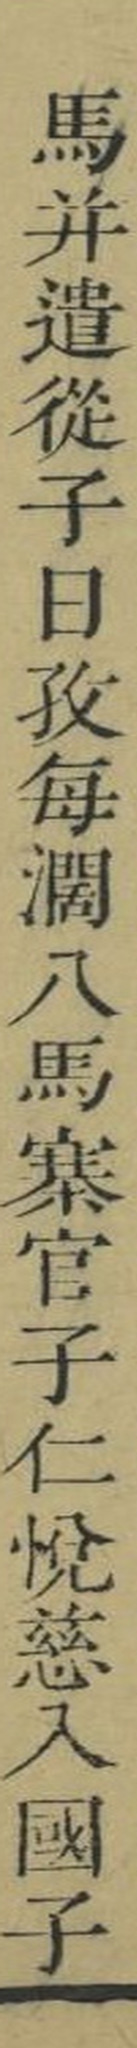馬并遣従子日孜毎濶八馬寨官子仁悦慈入国子
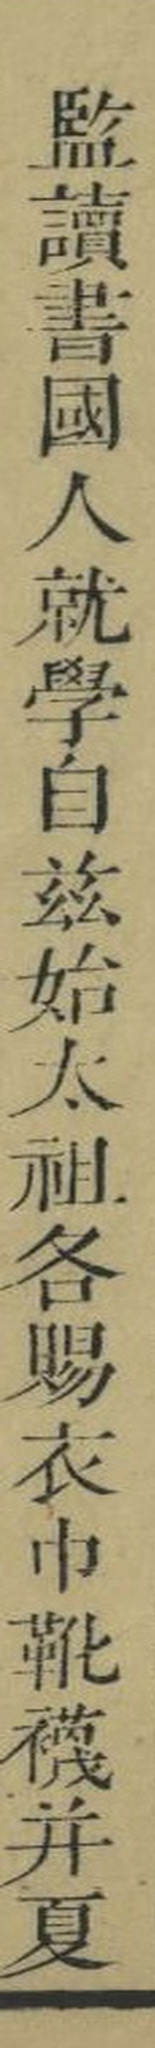監読書国人就学自茲始太祖各賜衣巾靴襪并夏
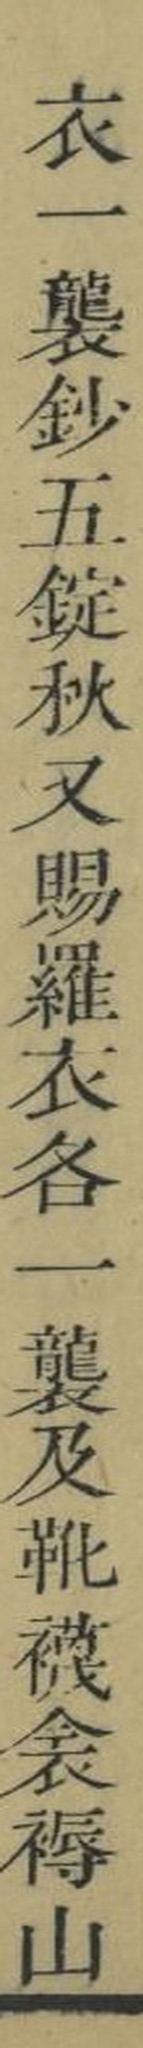衣一襲鈔五錠秋又賜羅衣各一襲及靴襪衾褥山
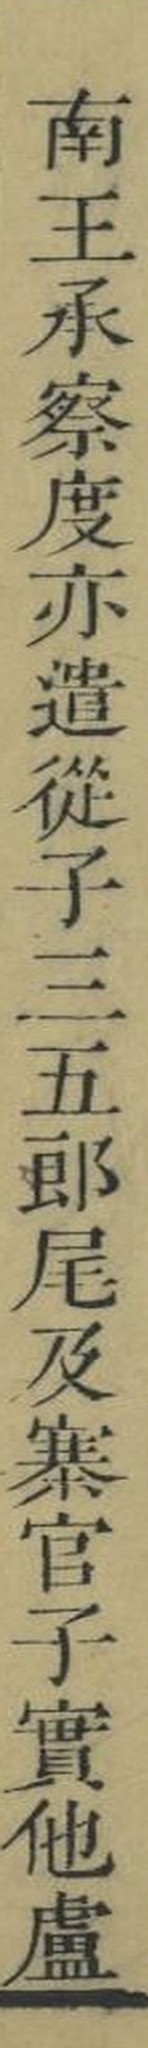南王承察度亦遣従子三五郎尾及寨官子実他盧
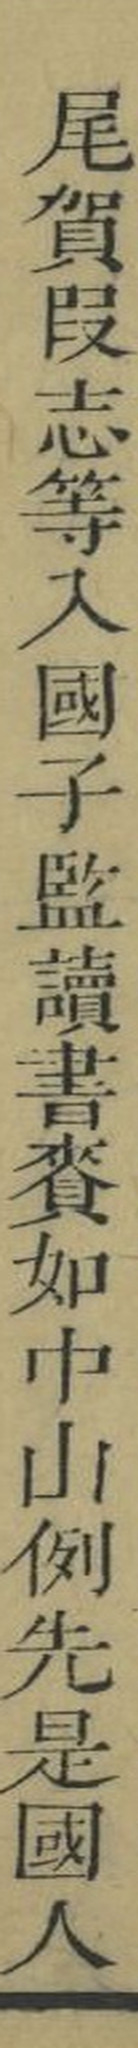尾賀叚志等入国子監読書賚如中山例先是国人
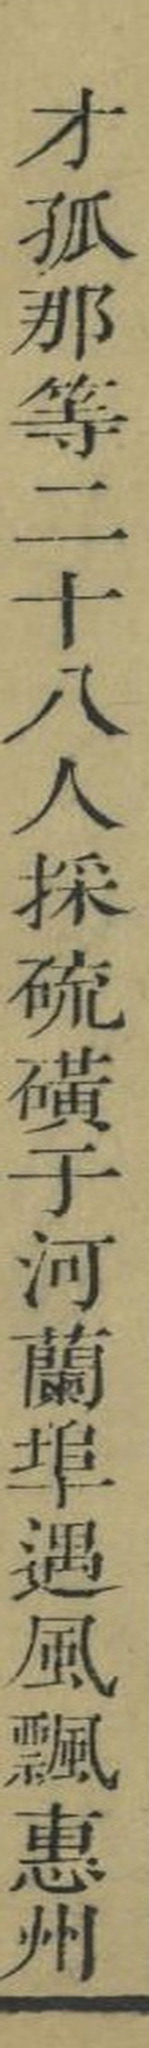才孤那等二十八人採硫磺于河蘭埠遇風飄恵州
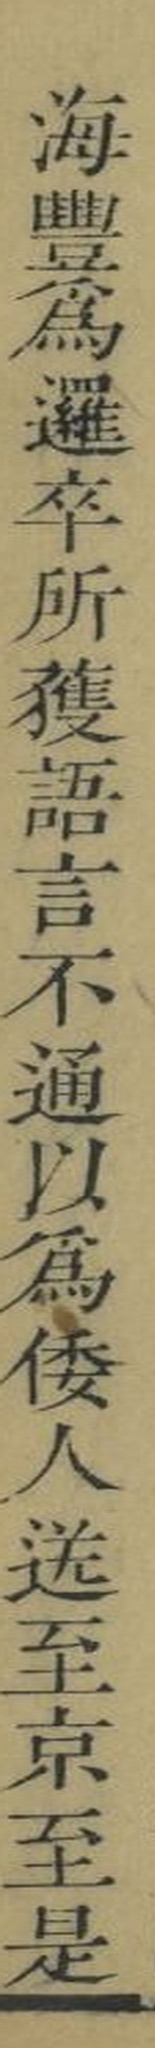海豊為邏卒所獲語言不通以為倭人送至京至是

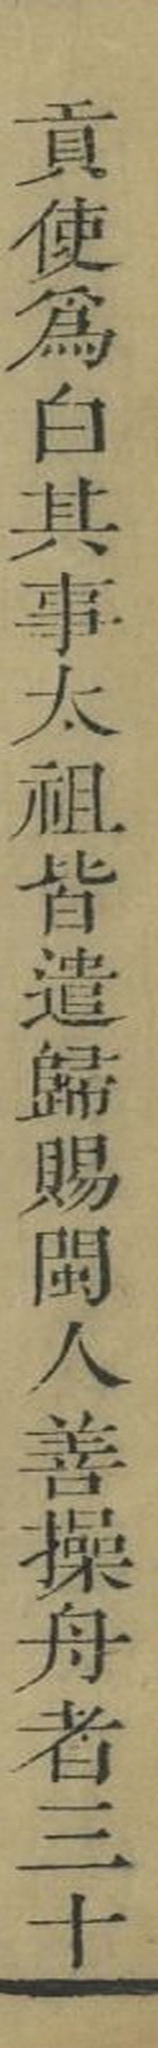貢使為白其事太祖皆遣帰賜閩人善操舟者三十
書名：中山伝信録 巻三
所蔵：University of the Ryukyus Library
